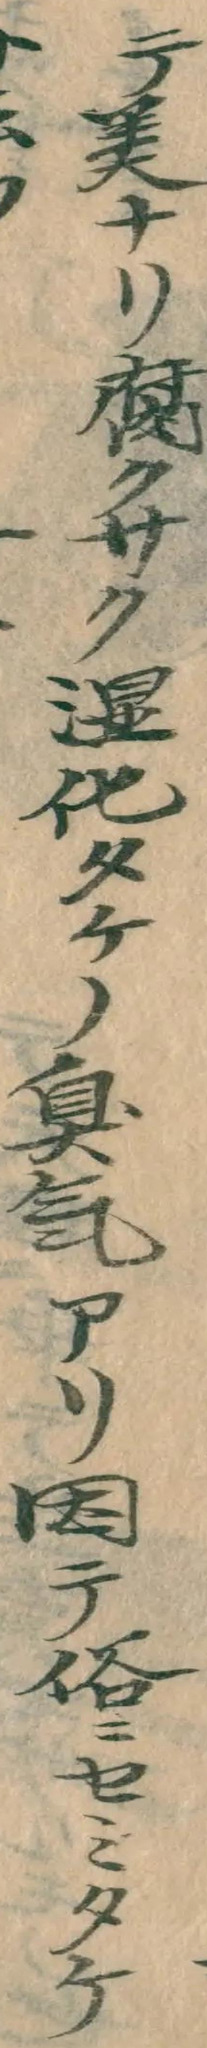テ美ナリ腐クサク湿地タケノ臭気アリ因テ俗ニセミタケ
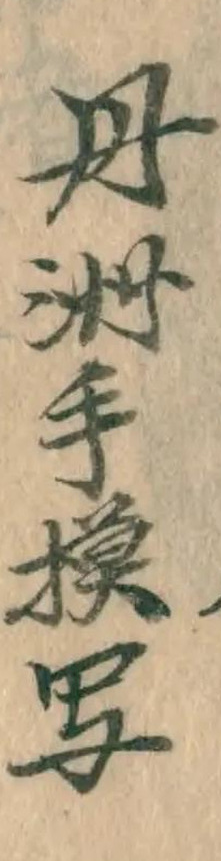丹州手模写

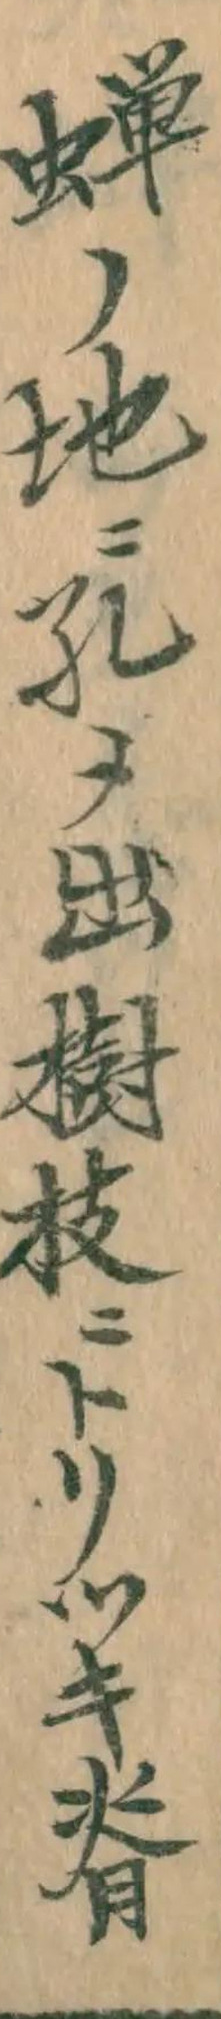蝉ノ地ニ孔シテ出樹枝ニトリツキ背
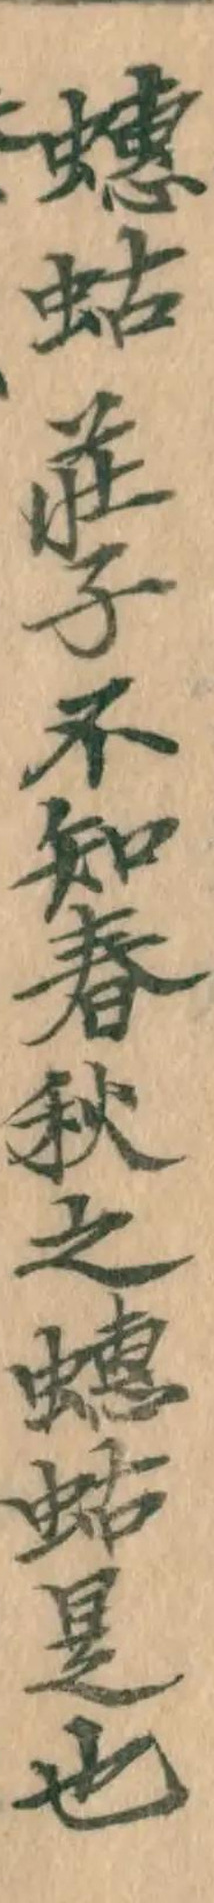蟪蛄草紙荘子不知春秋之蟪蛄是也
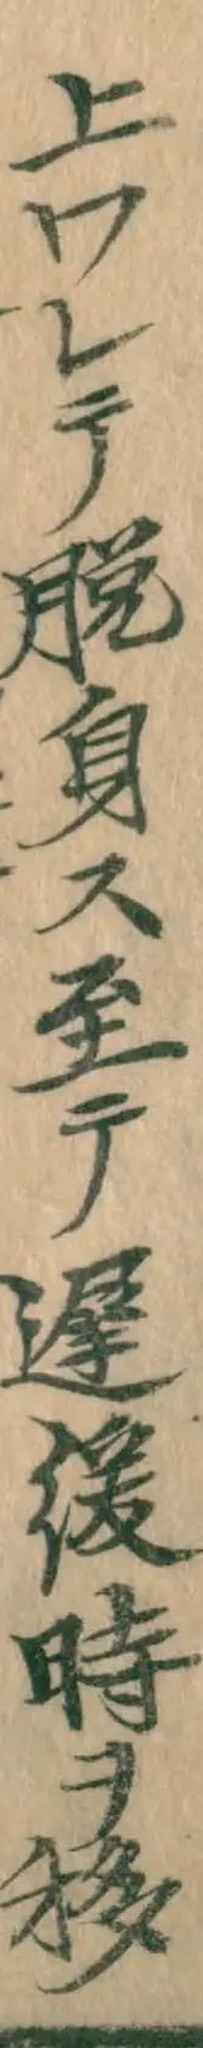上ワレテ脱身ス至テ遅緩時ヲ移
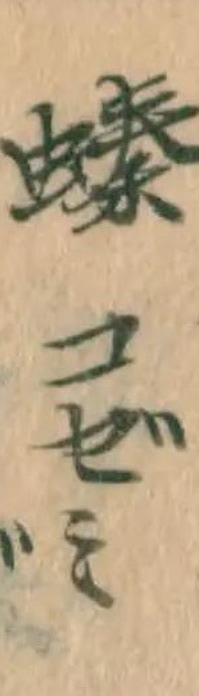螓コゼミ
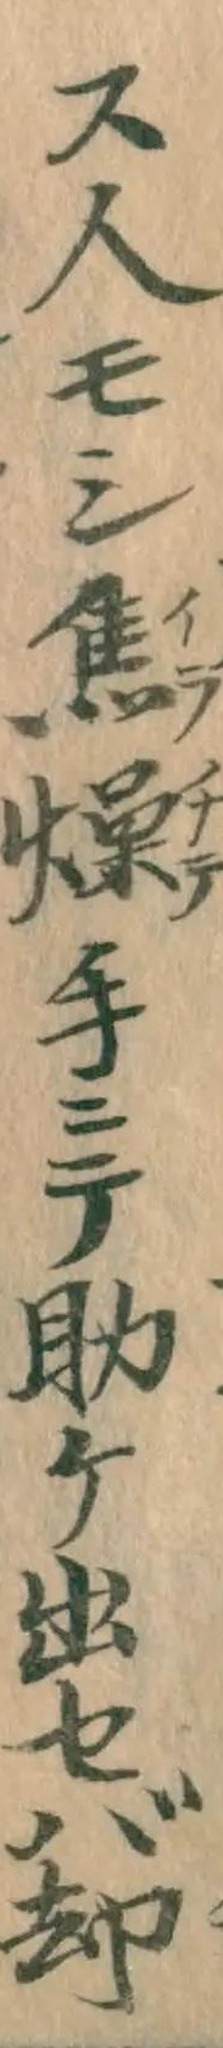ス人モシ焦燥手ニテ助ケ出セバ却
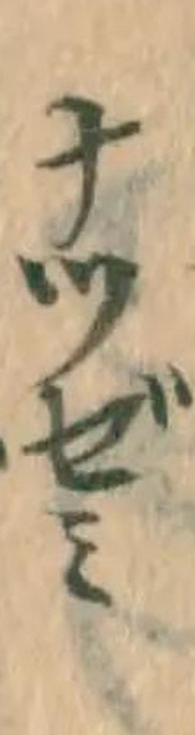ナツゼミ
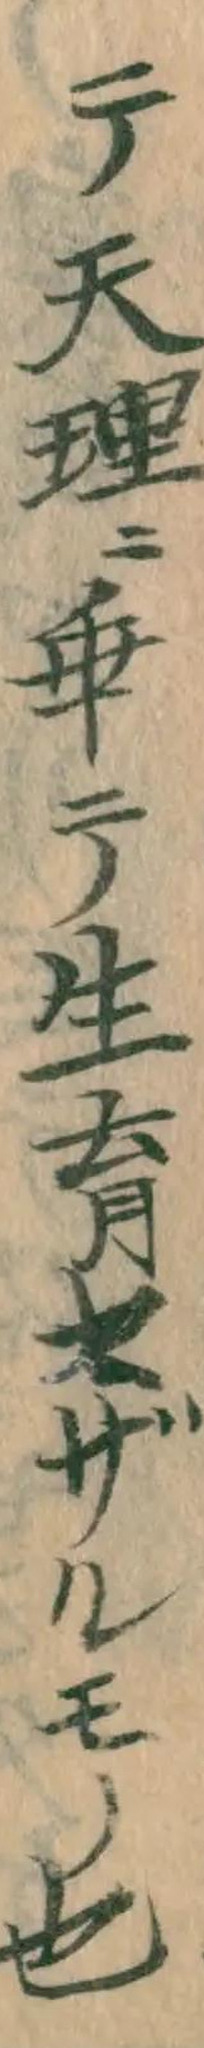天理ニ乖テ生育セザルモノ也
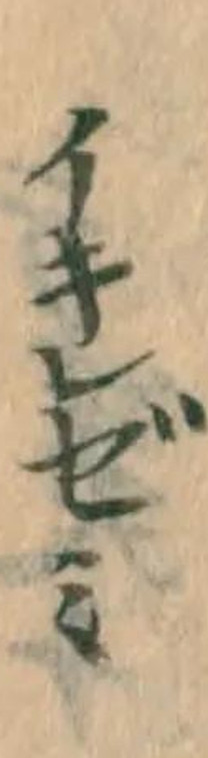イキレゼミ
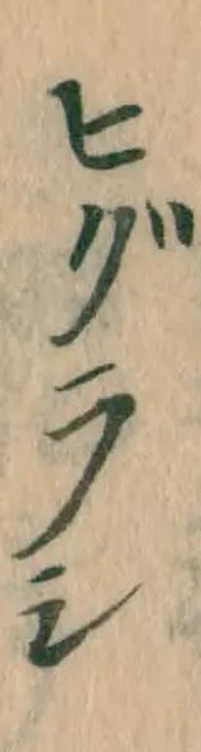ヒグラシ
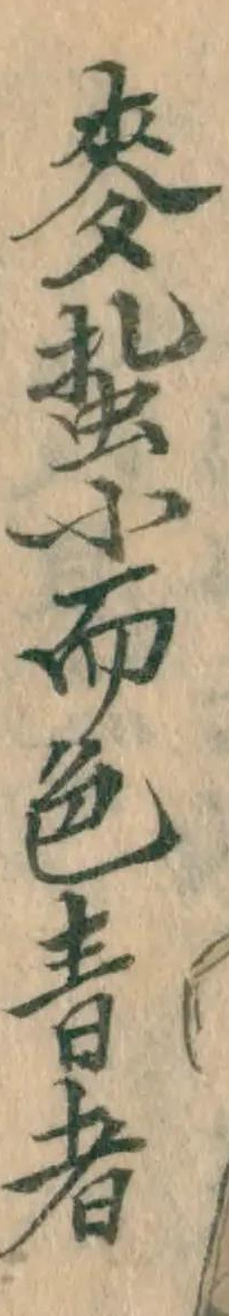麥𧉒小而色青者
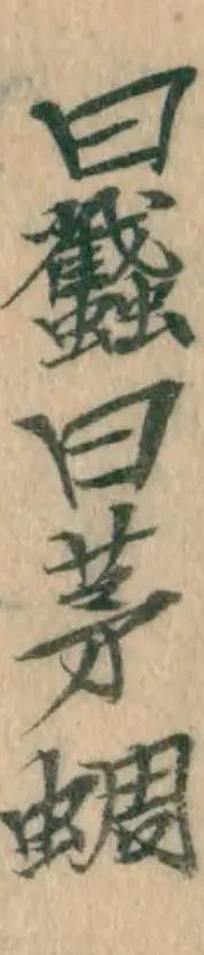曰蠽曰茅蜩

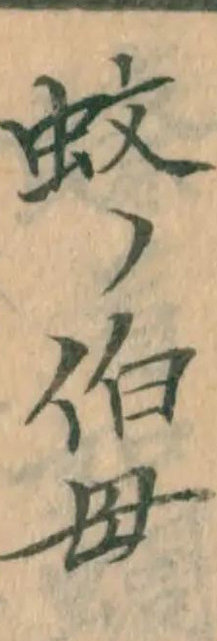蚊ノ伯母
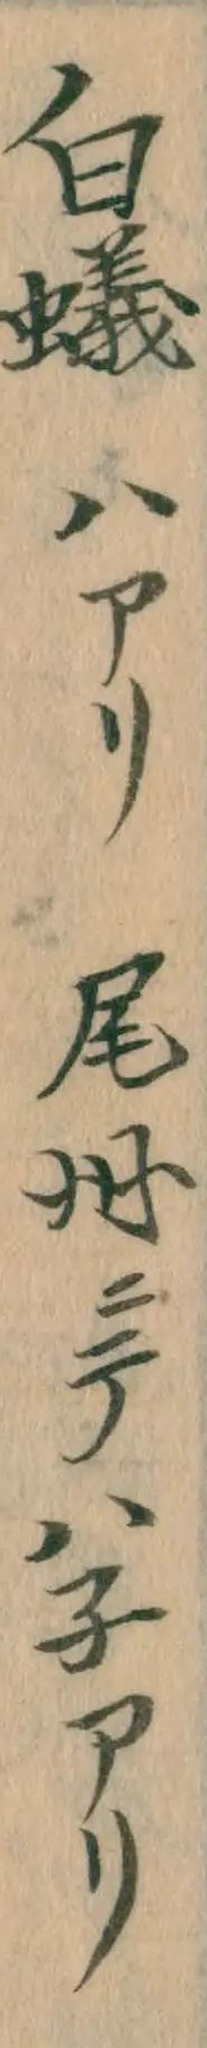白蟻ハアリ尾州ニテハハネアリ
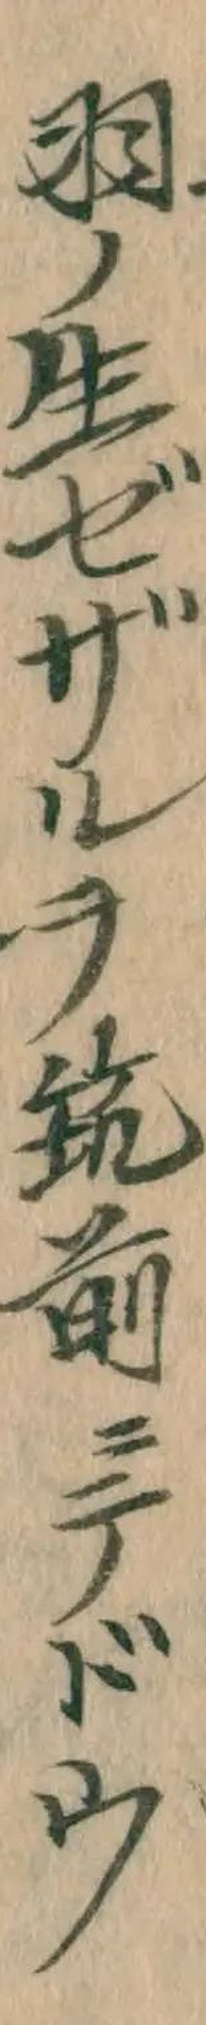羽ノ生ゼザルヲ筑前ニテドウ
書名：千蟲譜 3巻. [2]
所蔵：国立国会図書館 National Diet Library, JAPAN
